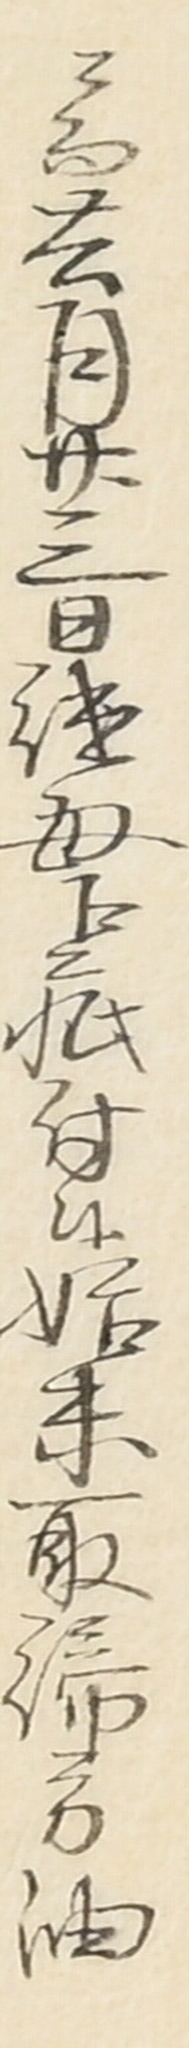ニ而去月廿三日継母江疵付候始末取締方油
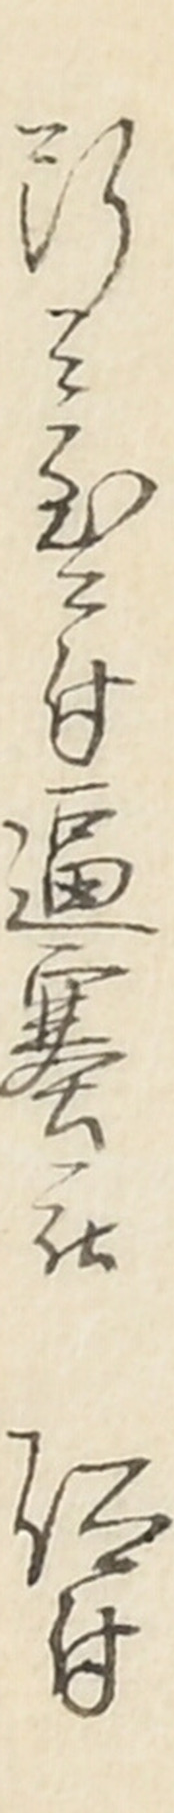断之至ニ付逼塞被仰付
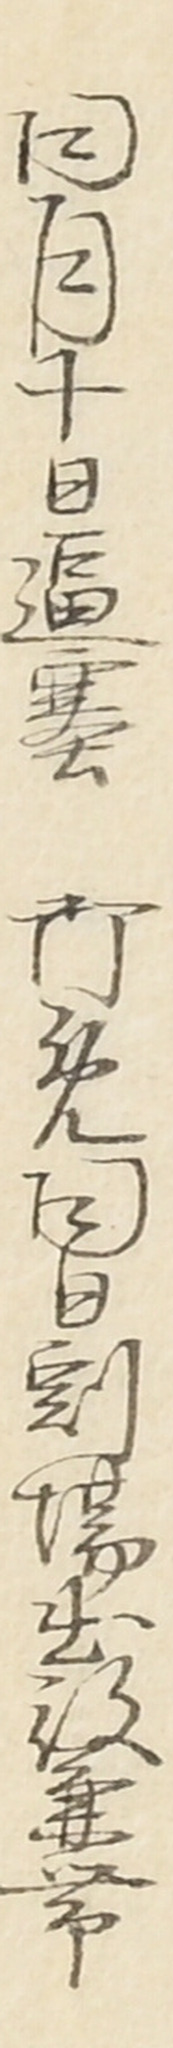一同月十日逼塞御免同日割場出役兼帯
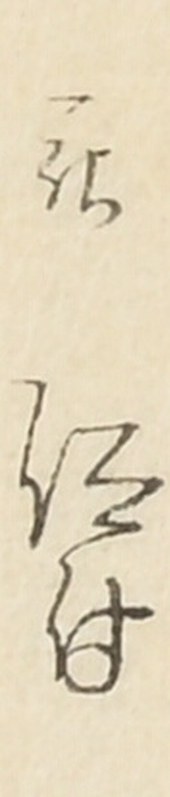被仰付
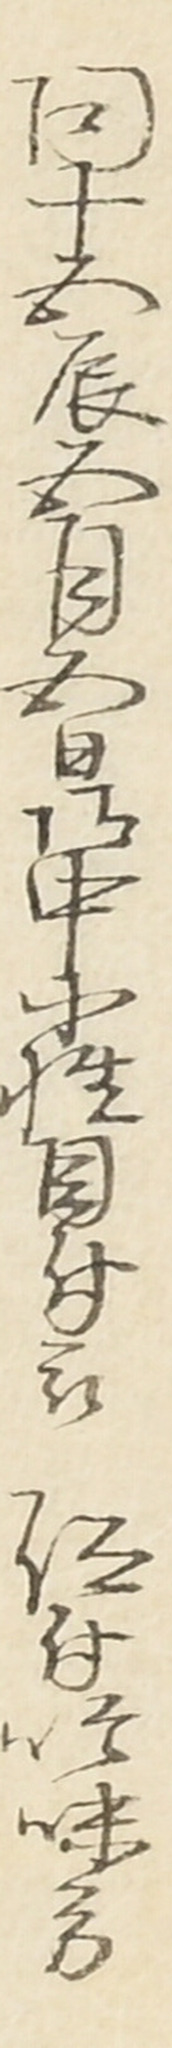一同十五辰五月五日御中小性目付被仰付吟味方
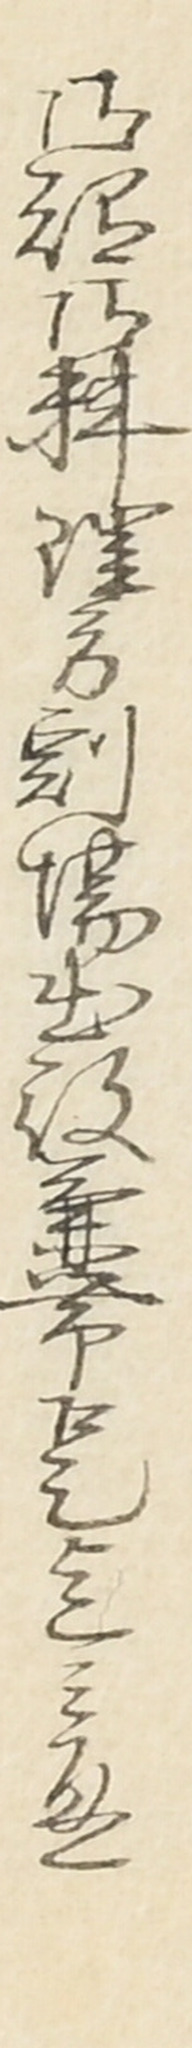御賄御料理方割場出役兼帯是迄之通
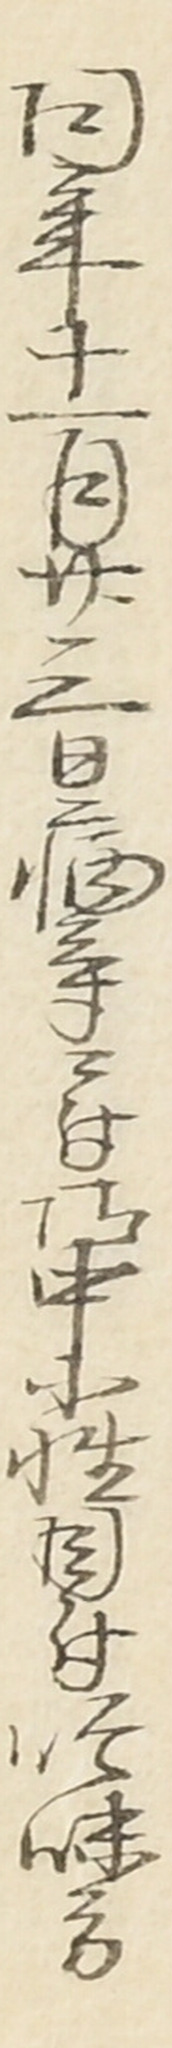一同年十一月廿三日病気ニ付御中小性目付吟味方
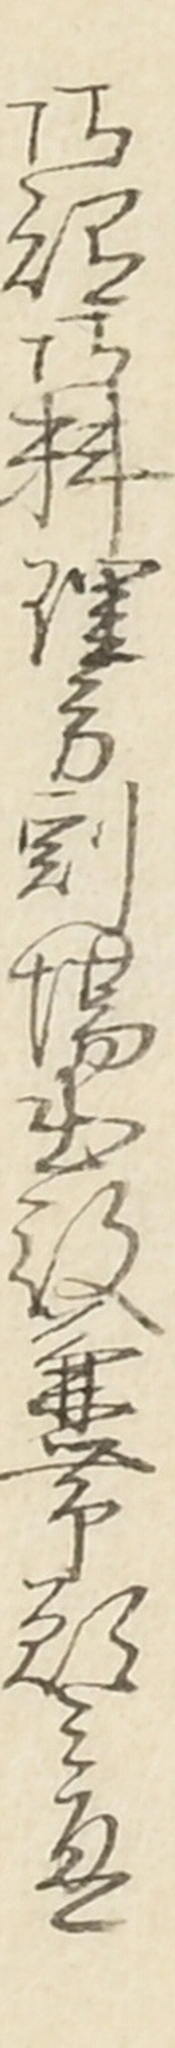御賄御料理方割場出役兼帯願之通
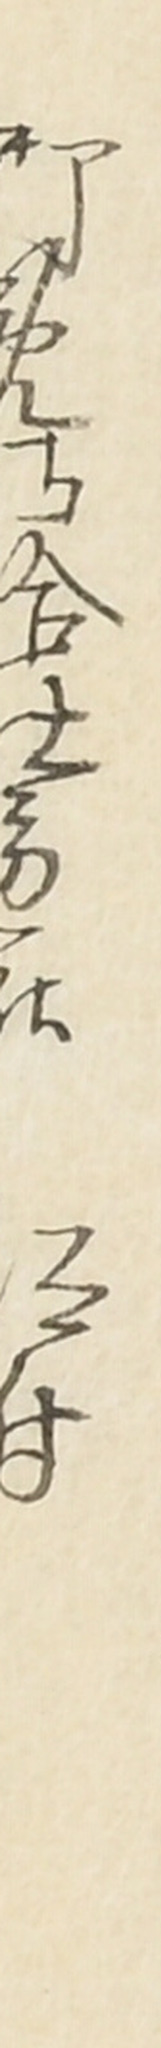御免御給仕方被仰付
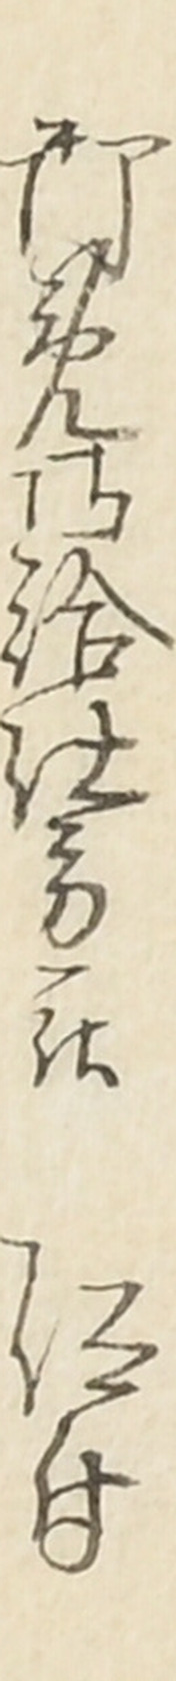御免御給仕方被仰付
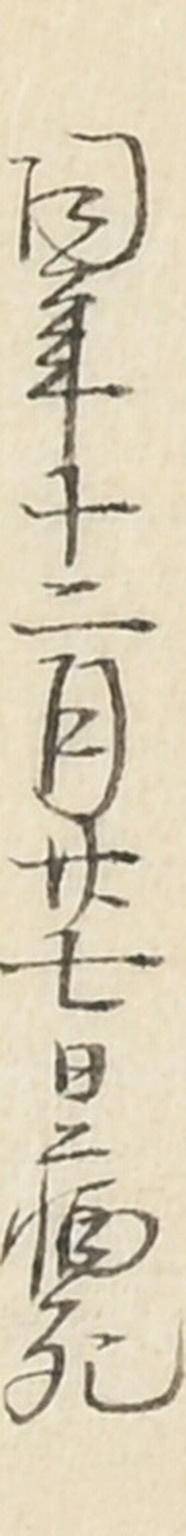一同年十二月廿七日病死

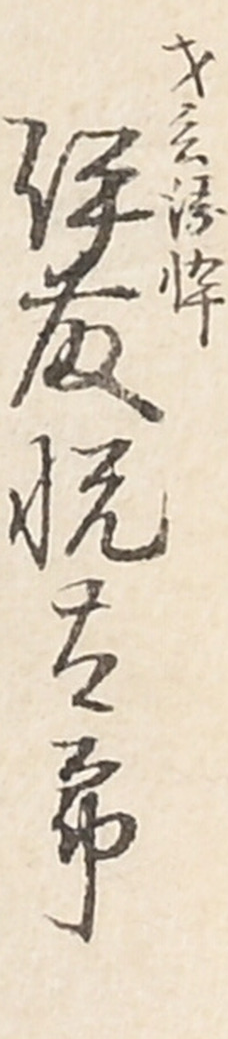伊藤悦太郎
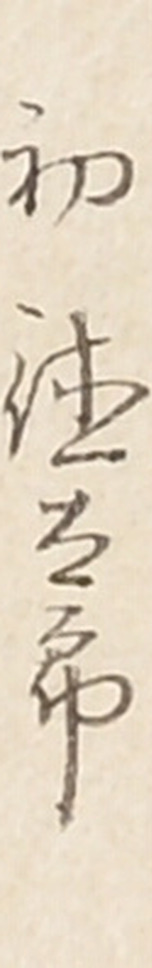初徳太郎
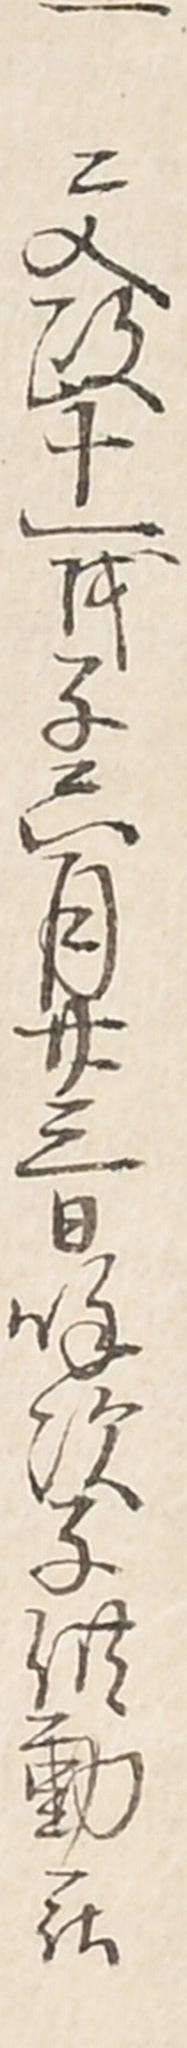一文政十一戊子六月廿三日呼次子供勤被
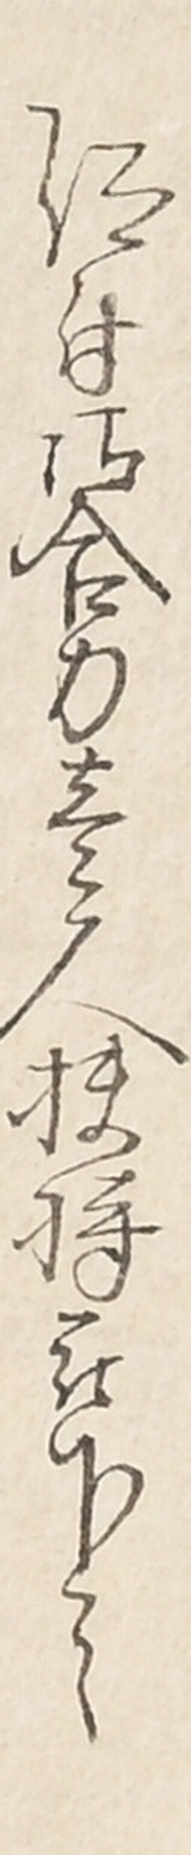仰付御合力壱人扶持被下之
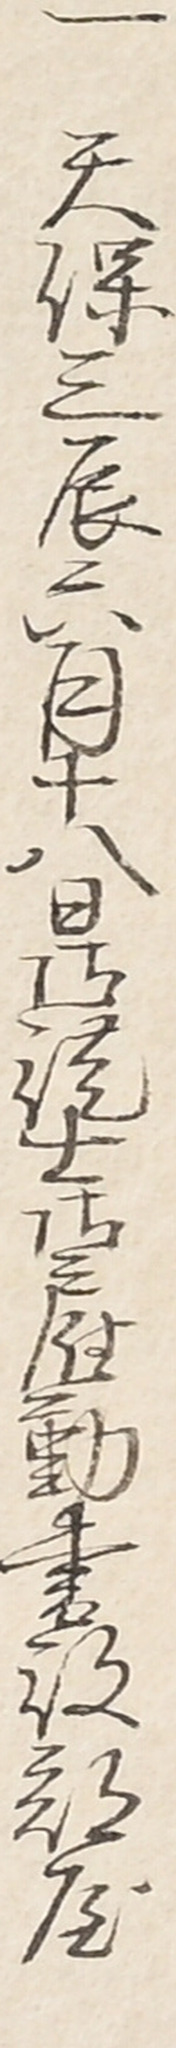一天保三辰六月十八日御徒士御雇勤書役部屋
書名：無足諸士勤仕録（四）
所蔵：伊那市立高遠町図書館・合同会社AMANE
